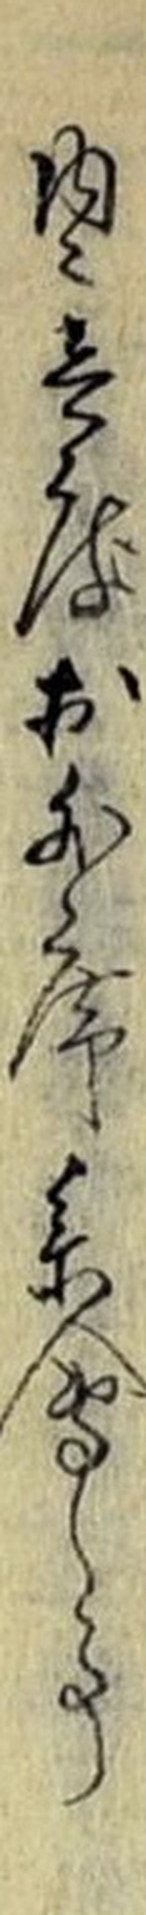内に壱度於外席参会候事
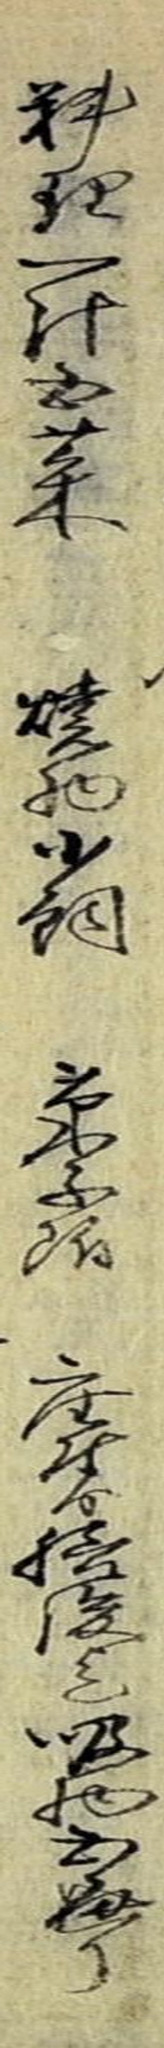料理一汁五菜焼物小鯛菓子附座付ゟ膳後迄吸物五通り
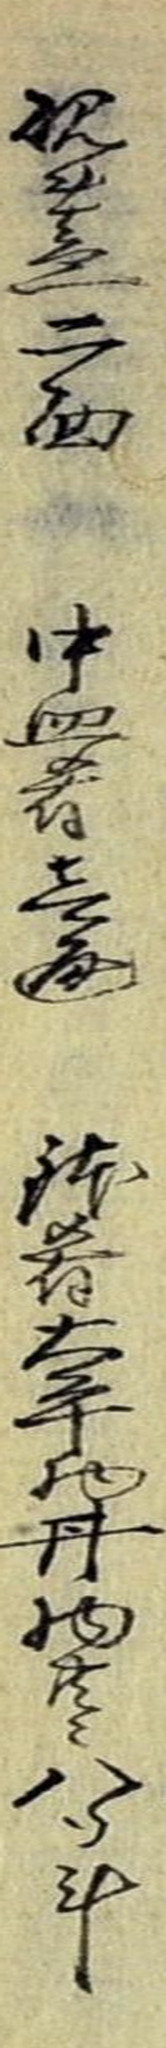硯蓋二面中皿肴壱通鉢肴大平物丼物共に八つ斗
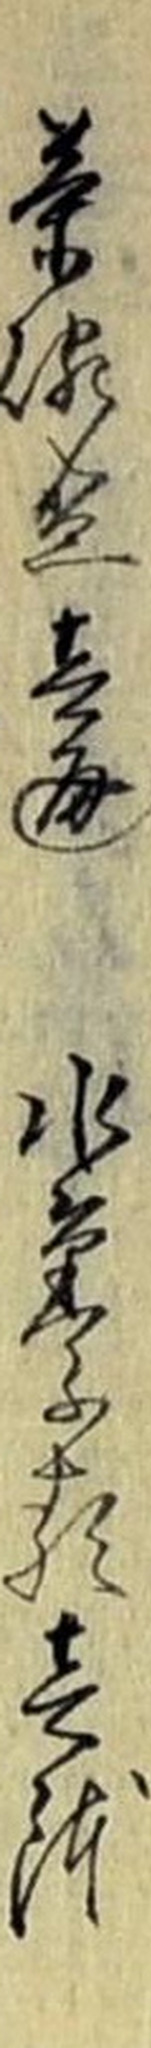茶碗盛壱通水菓子類壱鉢
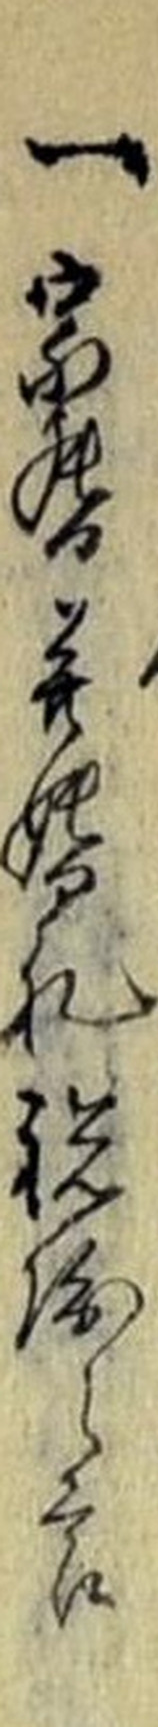一家督并婚礼祝儀之節
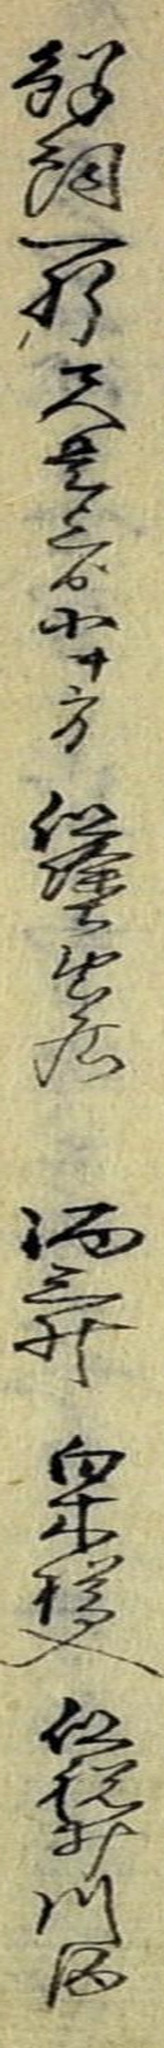鮮鯛一折尺是迄ゟ小キ方但塗臺居酒三升白木樽入但祝井川酒
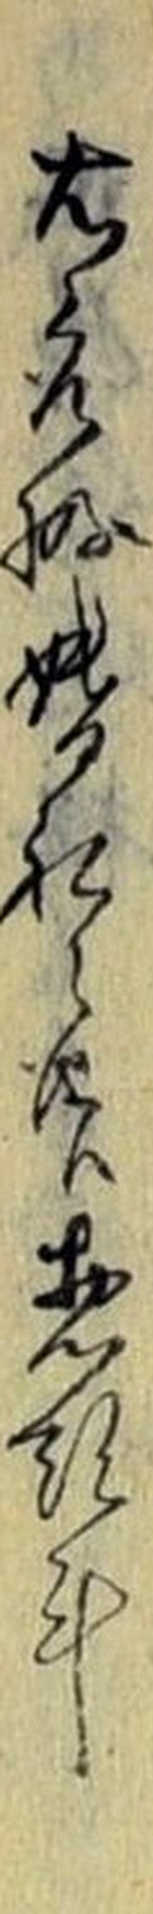右取扱婚礼之儀は惣礼斗
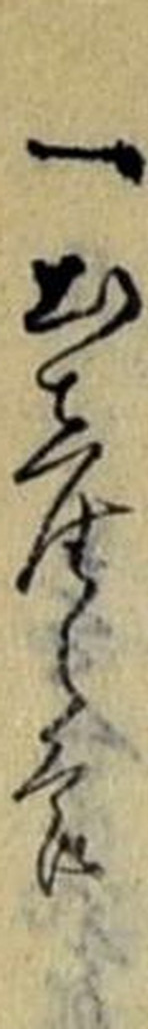一出産之節
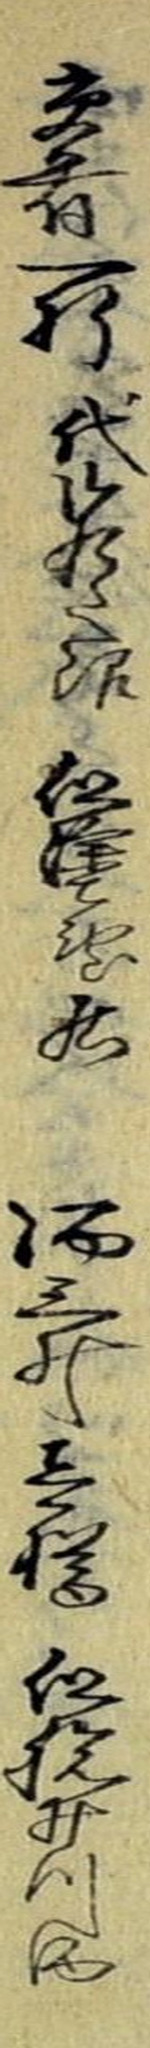交肴一折代弐拾匁銀但塗臺居酒三升壱樽但祝井川酒
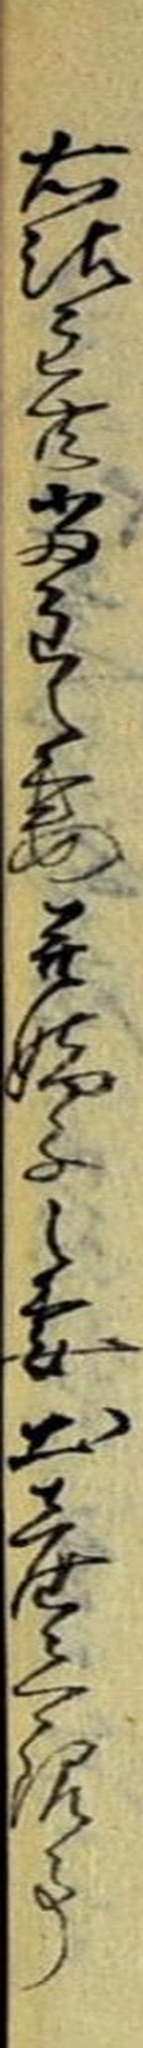右銀主共当主之妻并嫡子之妻出産に可限事
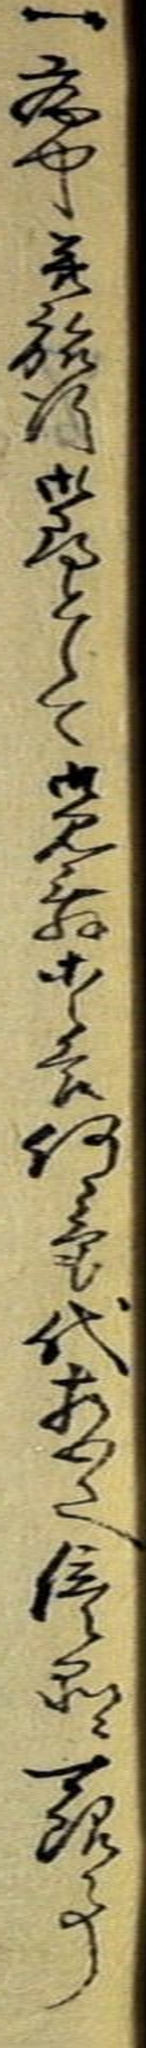一病中并旅行御尋として御見舞等之節何に而も代拾五匁位之品に可限事
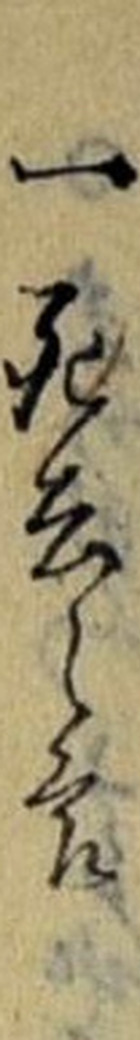一死去之節
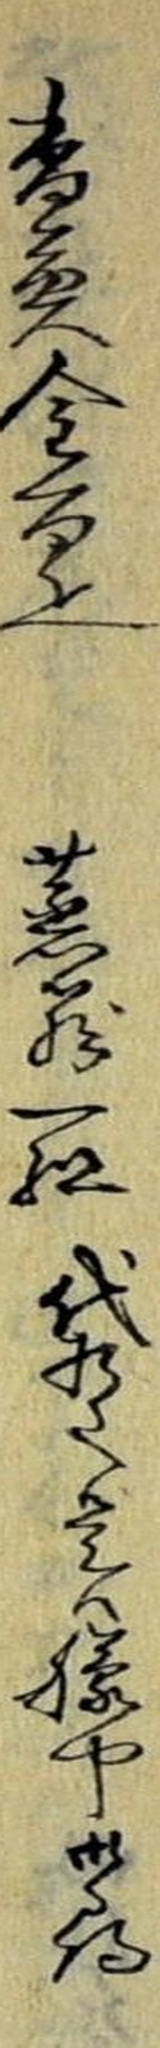香典金百疋蒸籠一組代拾匁是は朦中御尋
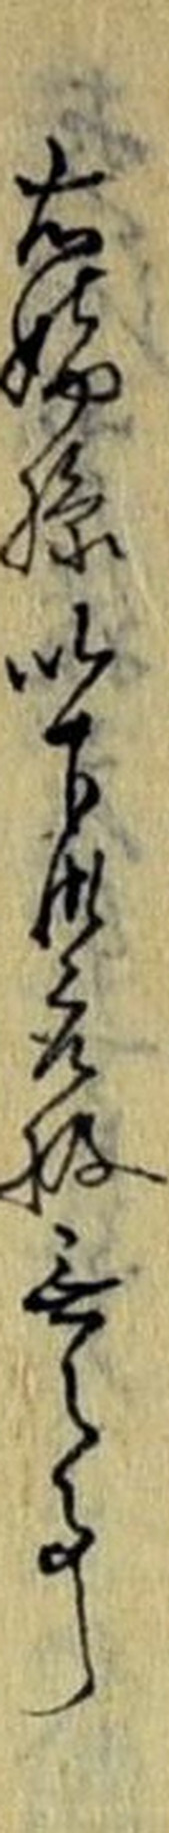右嫡孫以可御取扱無之事
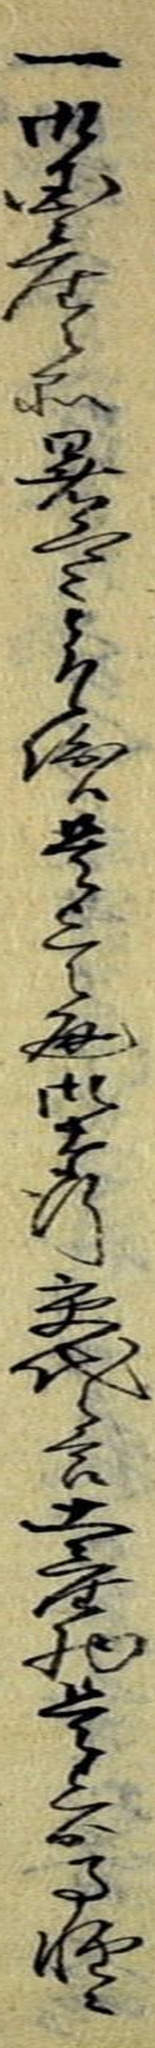一御国産之品暑寒に被下候儀は是迄之通御奉行交代之節は土産物是迄ゟ事軽に
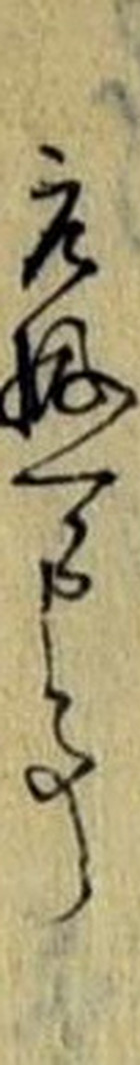取扱可申事
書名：命令之部 四
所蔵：福井県文書館 Fukui Prefectural Archives
